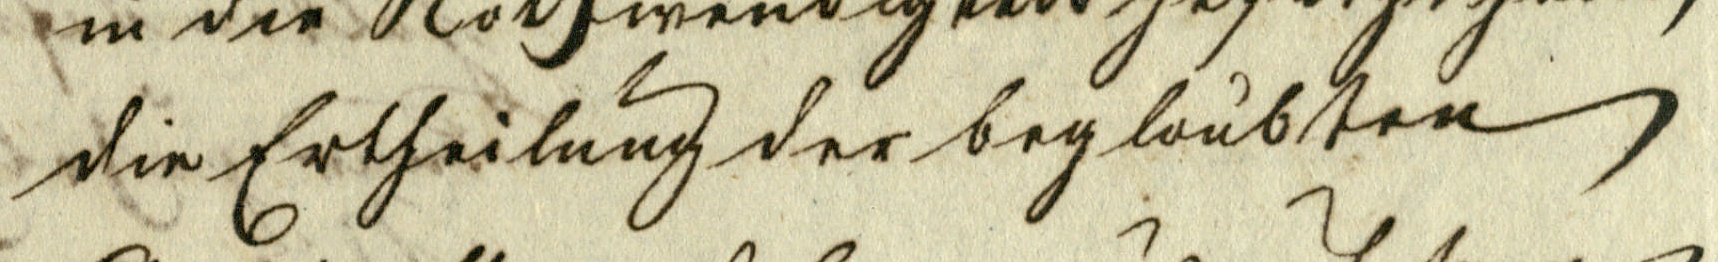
die Ertheilung der beglaubten
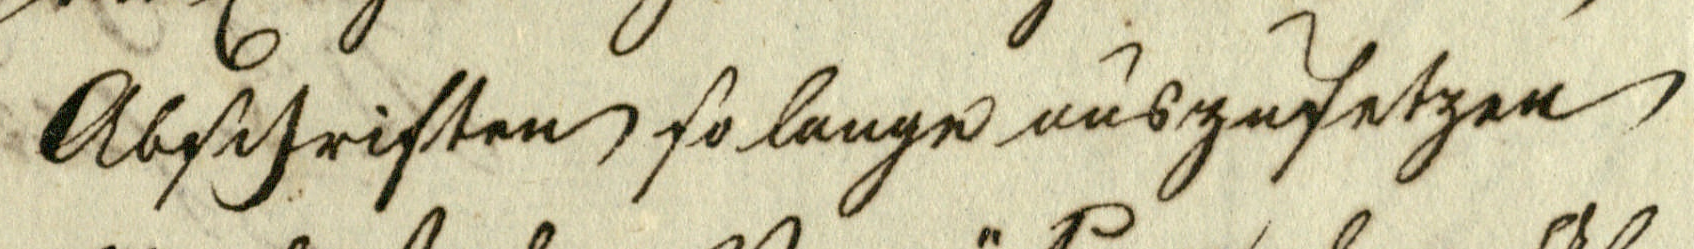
Abschriften, so lange auszusetzen
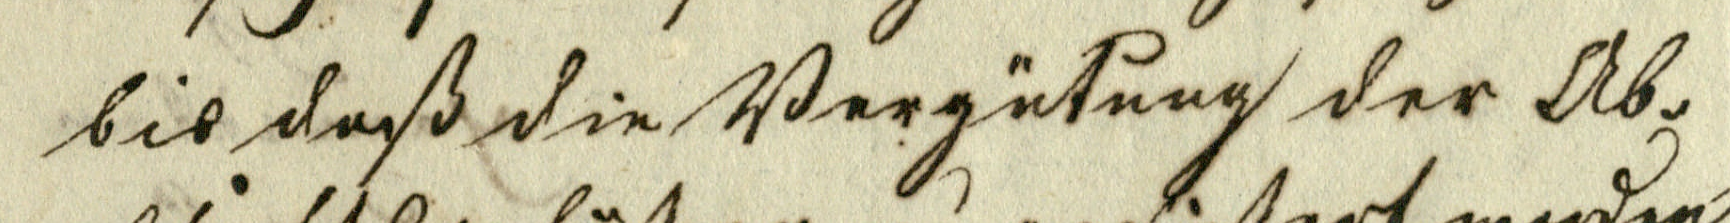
bis daß die Vergütung der Ab¬
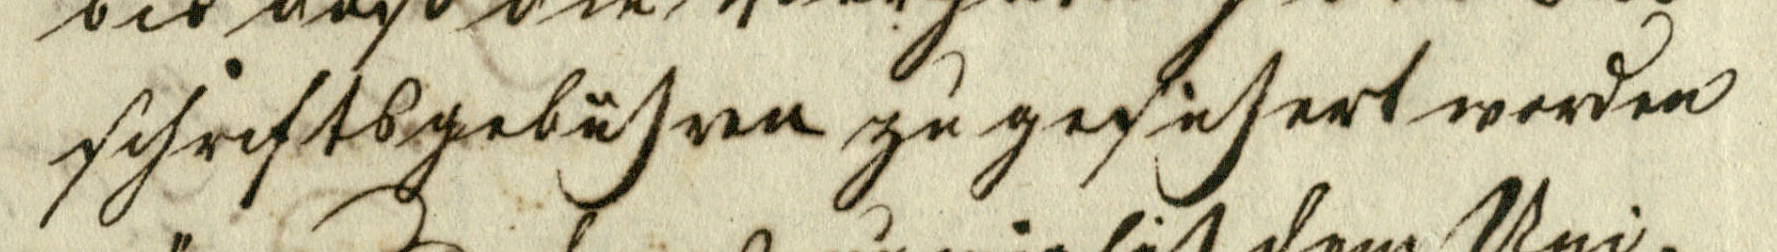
schriftsgebühren zu gesichert worden
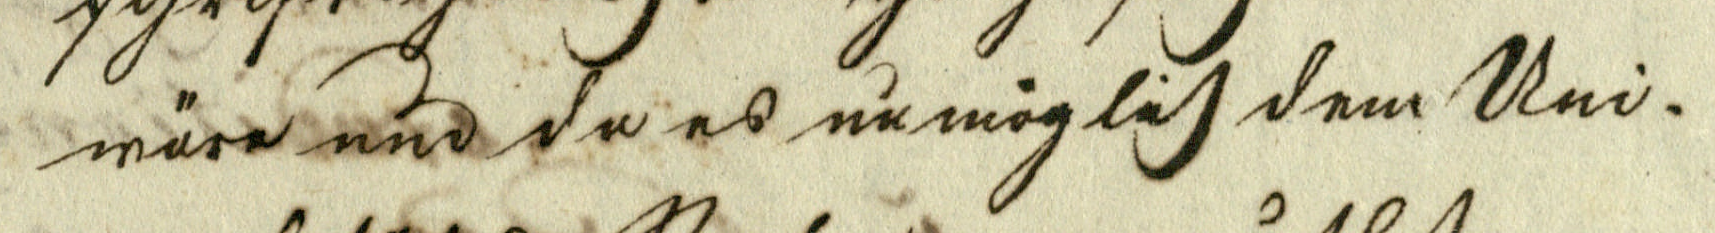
wäre und da es unmöglich dem Uni¬
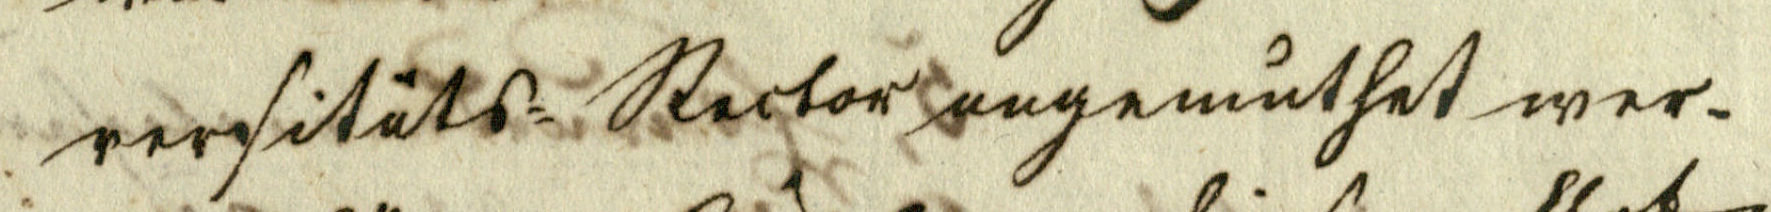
versitäts- Rector angemuthet wer¬
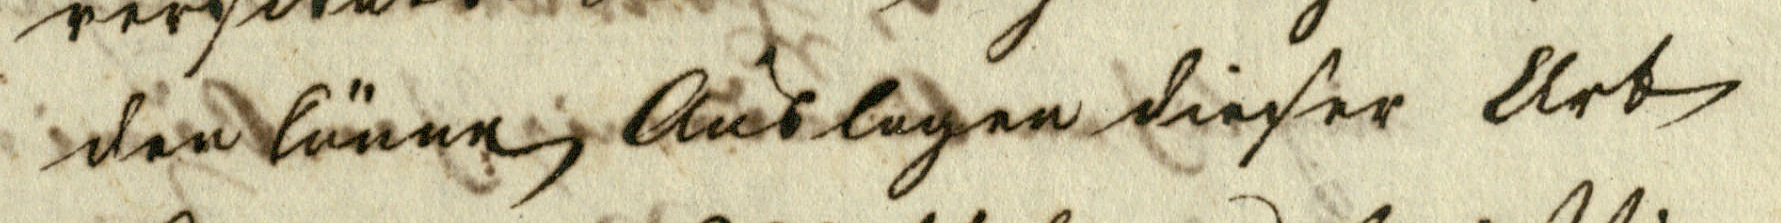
der könne Auslagen dieser Art
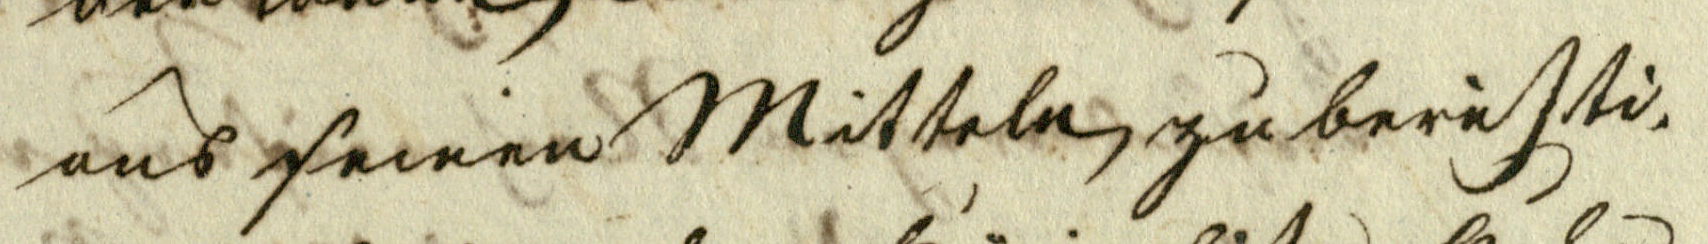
aus seinen Mitteln zu berichti¬
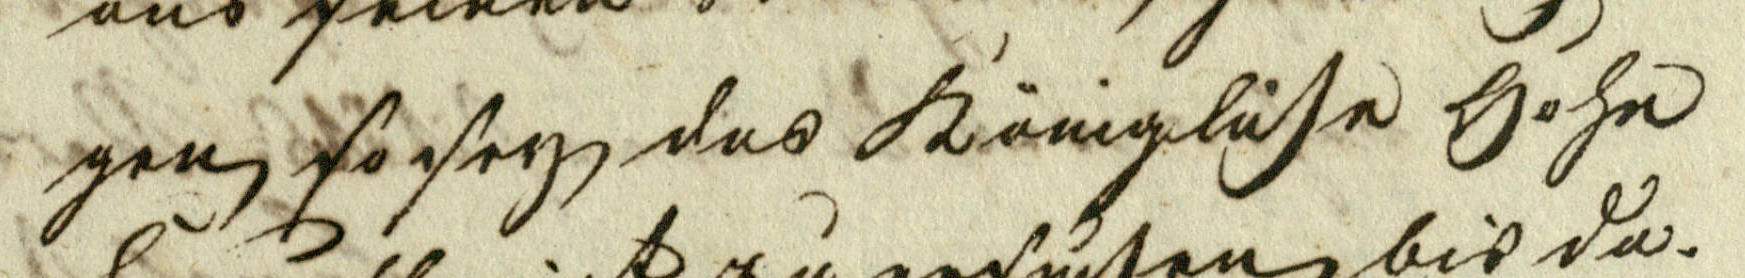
gen so fey das Königliche Hohe
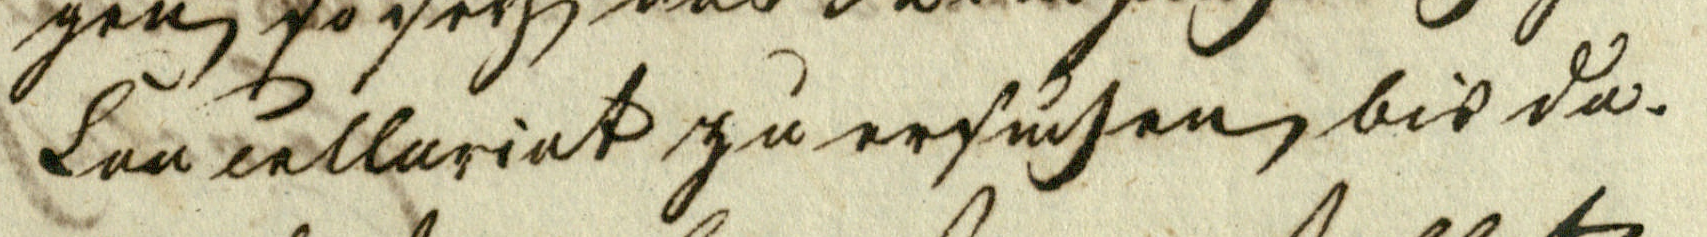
Cancellariat zu ersuchen bis da¬
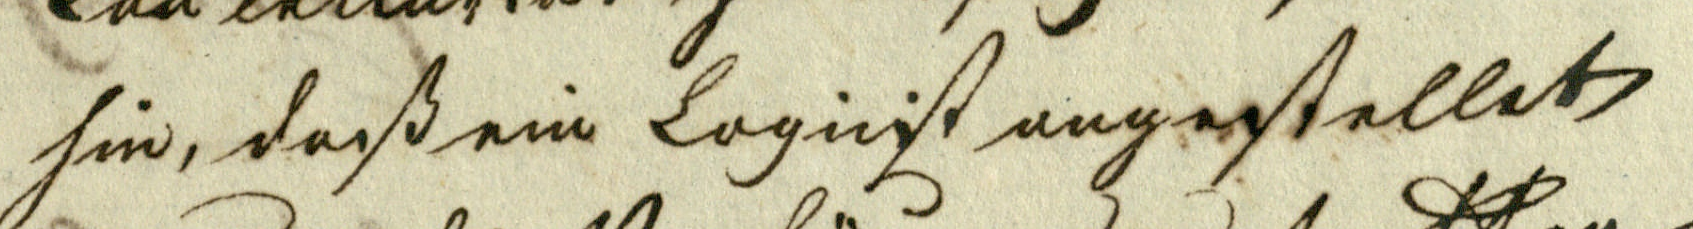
hin,, daß ein Cogiist angestellet
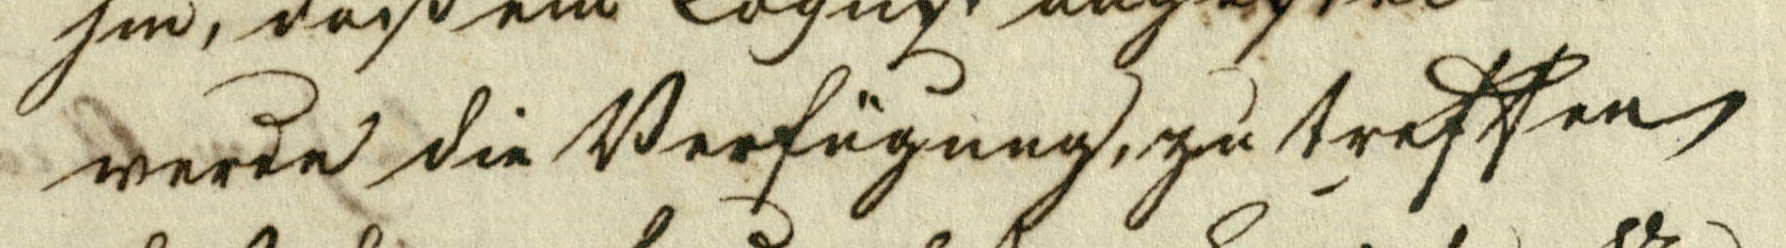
werde die Verfügung, zu treffen
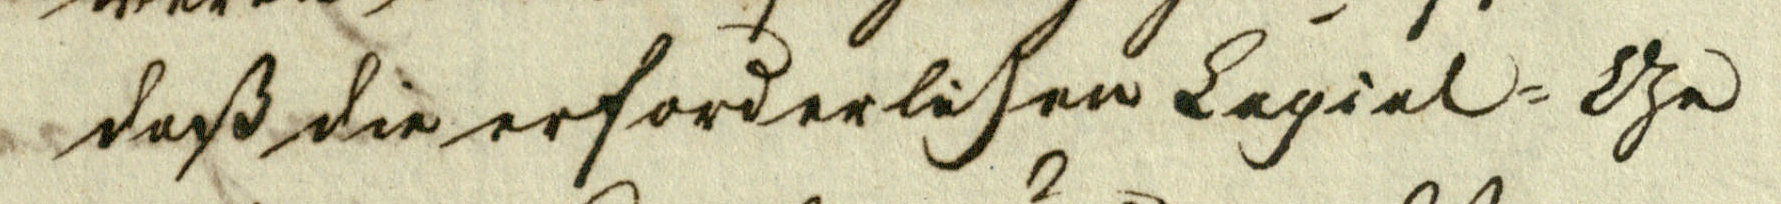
daß die erforderlichen Copial- Ge¬
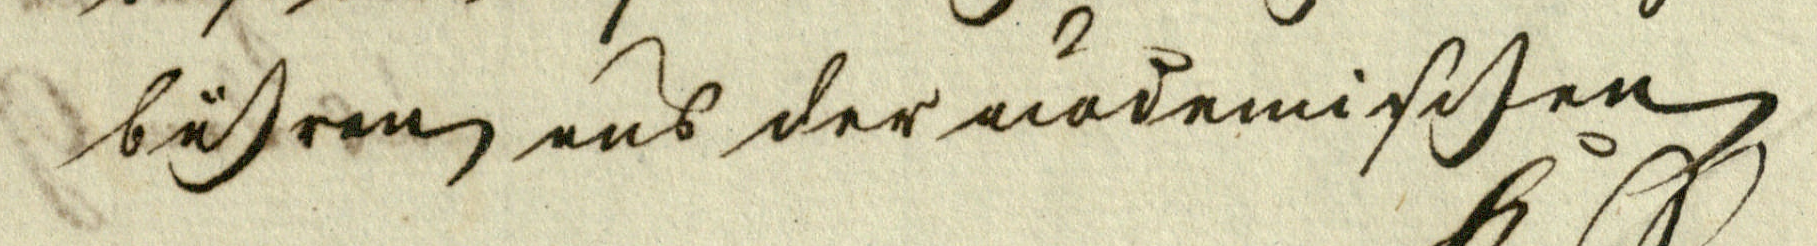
bühren aus der academischen
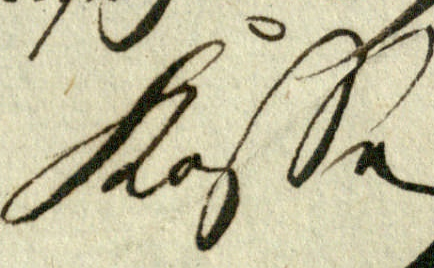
Kasse
